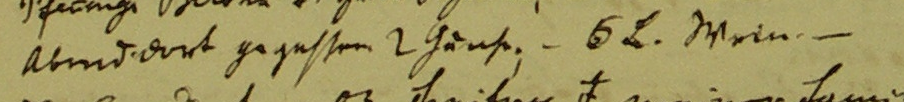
Abend dort gegessen 2 Gänge: -- 6 L. Wein.—
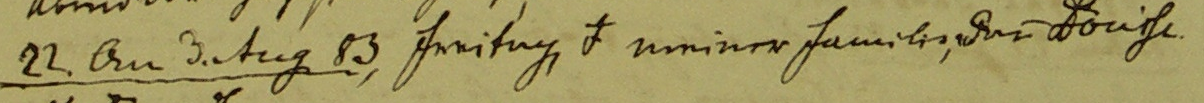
22) Am 3. Aug. 83, Freitag, mit meiner Familie dann Louise
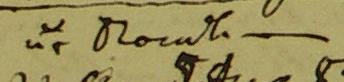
und Draudt.—
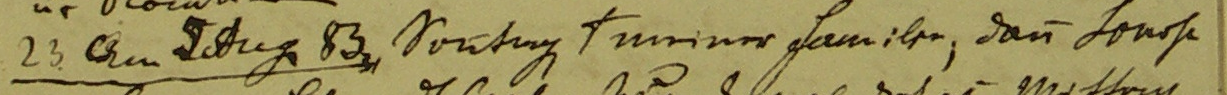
23) Am 5. Aug. 83 Sonntag mit meiner Familie, dann Louise
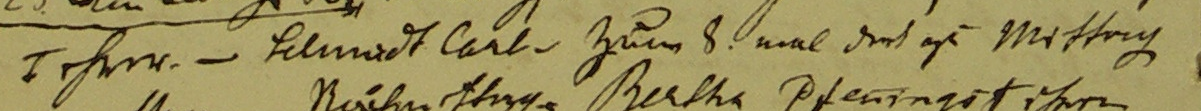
mit Ihrer.- Schmidt Carl. Zum 8. mal dort zu Mittag
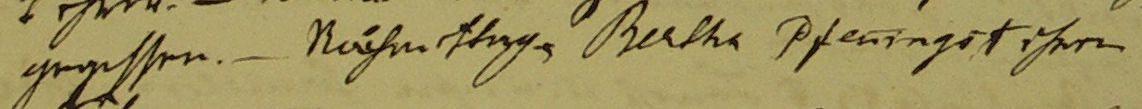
gegessen.—Nachmittags Bertha Pfenniges mit
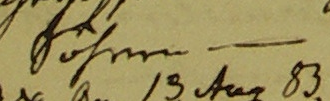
Ihren Söhnen.—
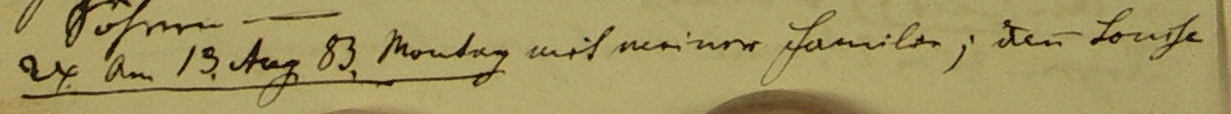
24) Am 15. Aug. 83. Montag mit meiner Familie, dann Louise
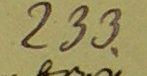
233
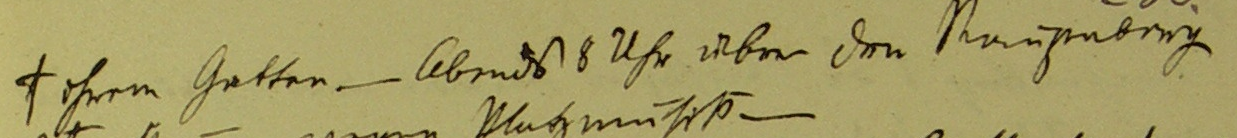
Mit ihrem Gatten—Abends 8 Uhr über den Raupenberg
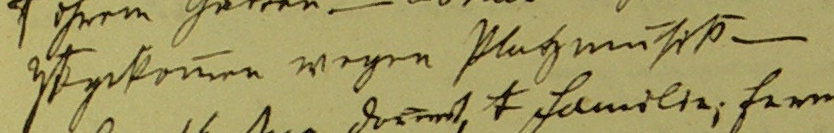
zurückgekommen wegen Platzmusik.-
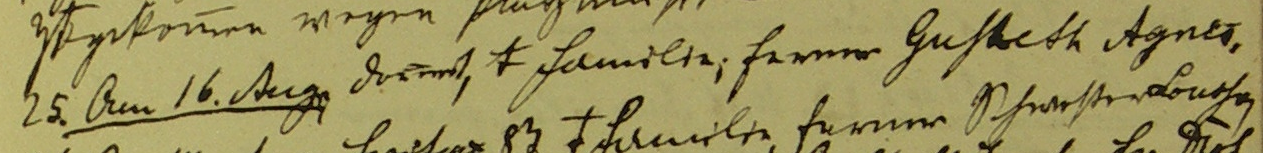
25) Am 16. Aug. 83 . Donnerstag Mit Familie; ferner Gusbeth Agnes.
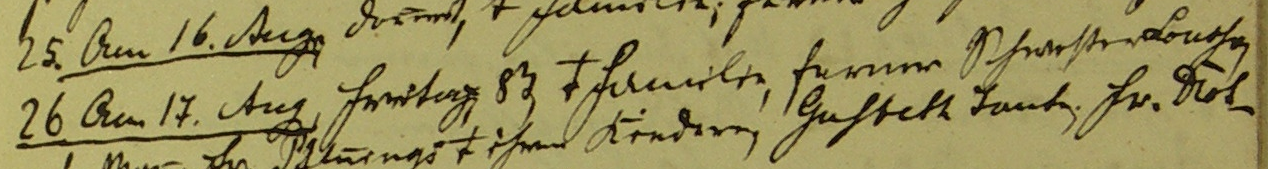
26) Am 17. Aug. 83. Freitag. Mit Familie , ferner Schwester Louise,
